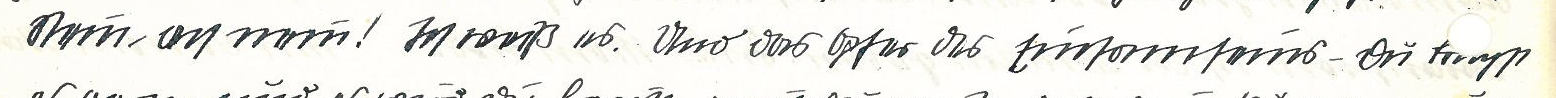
Nein, ach nein! Ich weiß es. Und das Opfer des Einsamseins – Du trgst
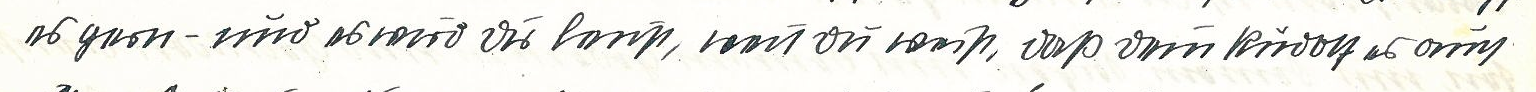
es gern – und es wird Dir leicht, weil Du weißt, daß Dein Rudolf es auch
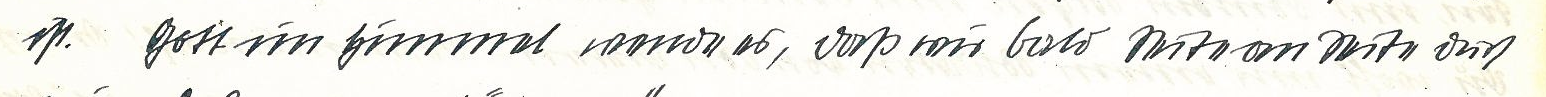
ist. Gott im Himmel wende es, daß wir bald Seite an Seite durch
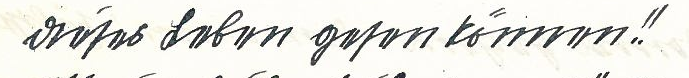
dieses Leben gehen können!!
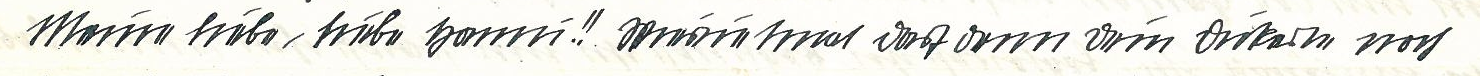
Meine liebe, liebe!! Wievielmal darf denn Dein Dickerle noch
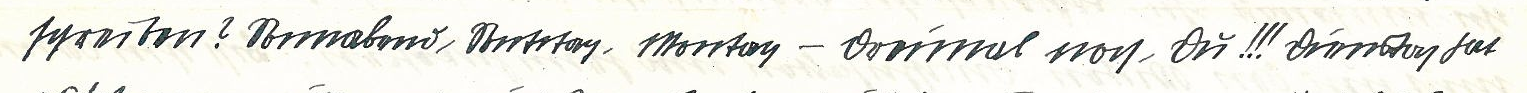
schreiben? Sonnabend, Sonntag, Montag – dreimal noch, Du!!! Dienstag hat
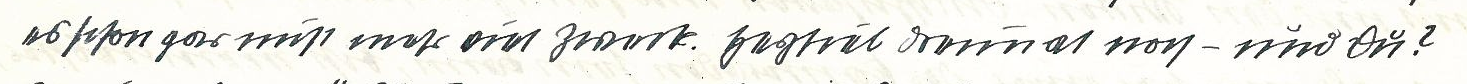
es schon gar nicht mehr viel Zweck. Herzlieb dreimal noch – und Du?
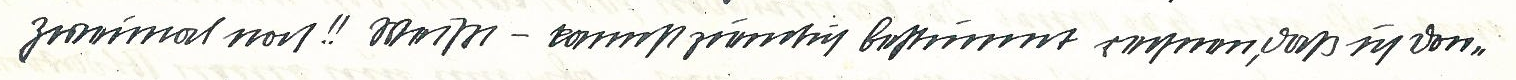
Zweimal noch!! Weißt – kannst ziemlich bestimmt rechnen, daß ich Don¬
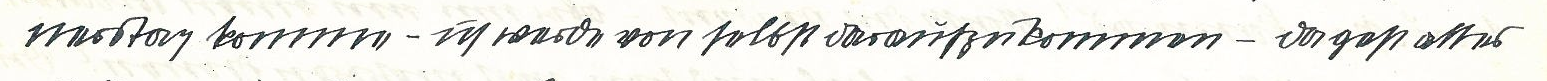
nerstag komme – ich werde von selbst darauszukommen – da geht alles
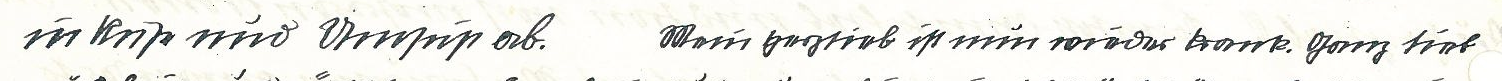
in Ruhe und Umsicht ab. Mein Herzlieb ist nun wieder krank. Ganz lieb
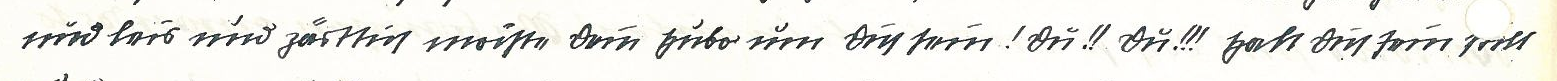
und leis und zärtlich möchte Dein Hubo um Dich sein! Du!! Du!!! Halt Dich fein ill und
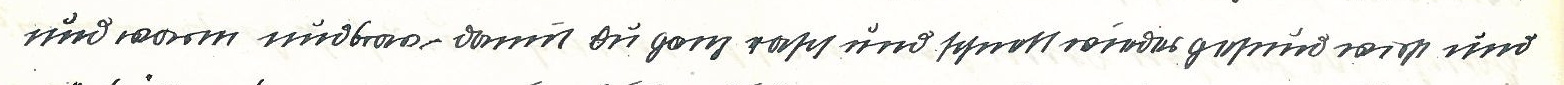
warm und brav, damit Du ganz rasch und schnell wieder gesund wirst und
